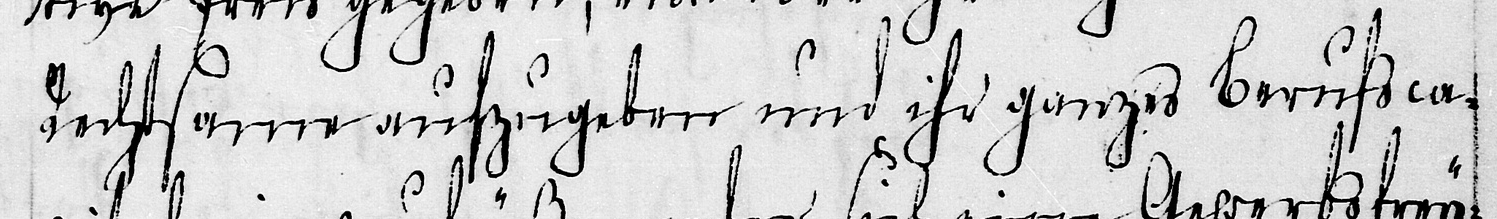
Rechtsame aufzugeben und ihr ganzes Berufsca¬
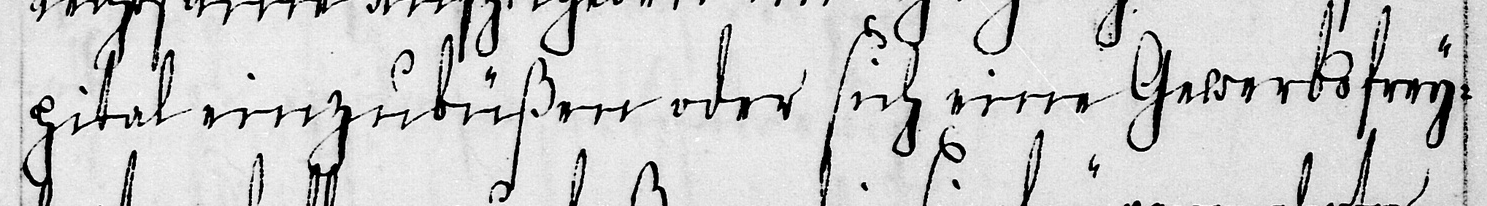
pital einzubüßen oder sich eine Gewerbsfrey¬
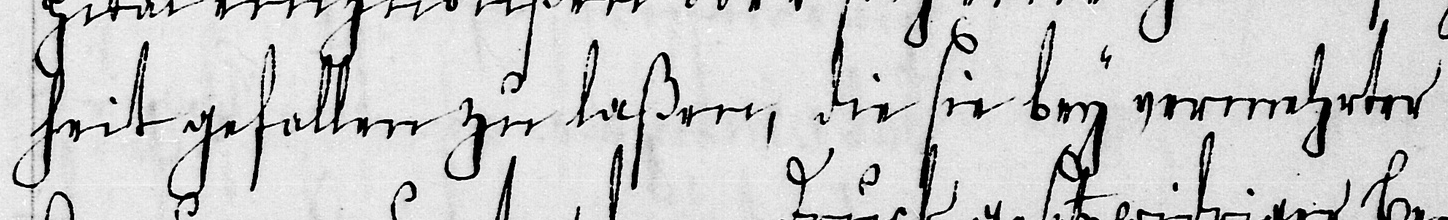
heit gefallen zu laßen, die sie bey vermehrter
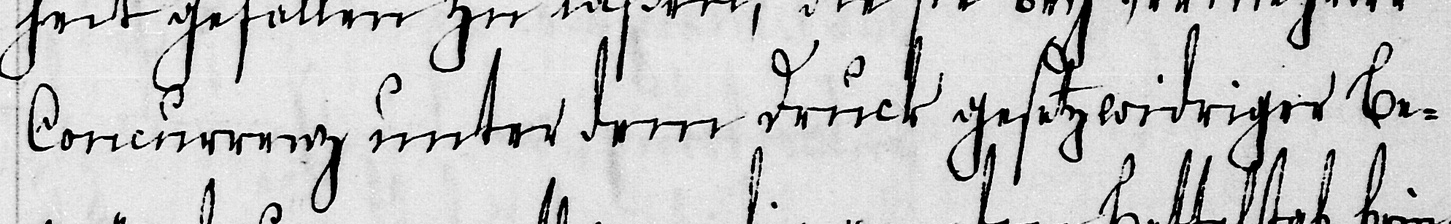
Concurrenz unter dem Druck gesetzwidriger Be¬
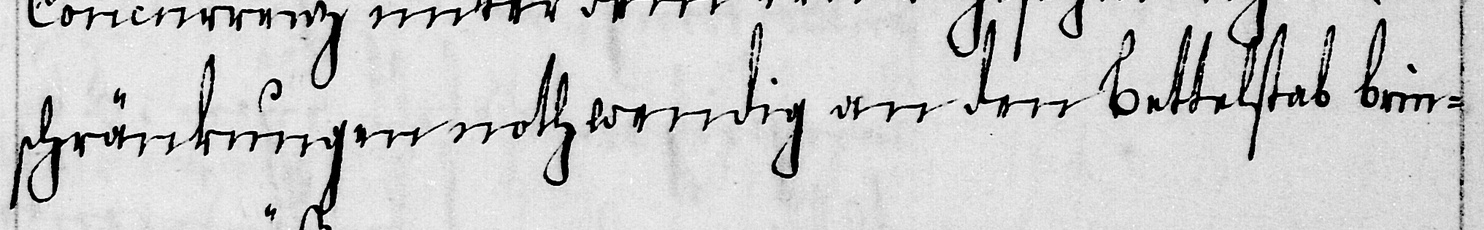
schränkungen nothwendig an den Bettelstab brin¬
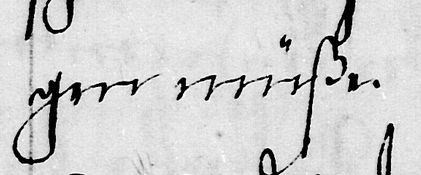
gen müße.
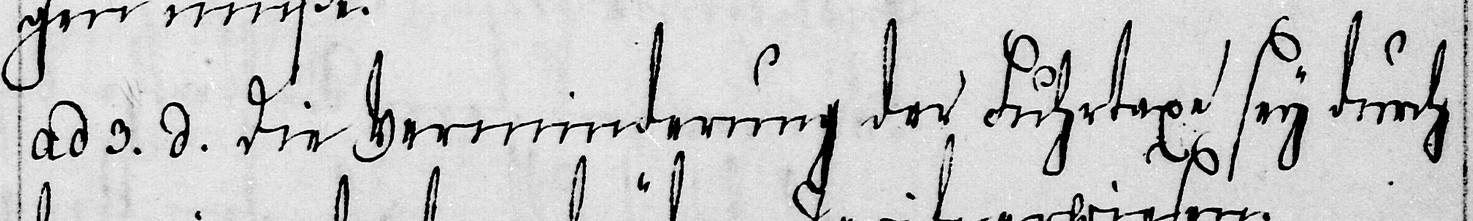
ad 3. d. Die Verminderung der Fuhrtaxe sey durch
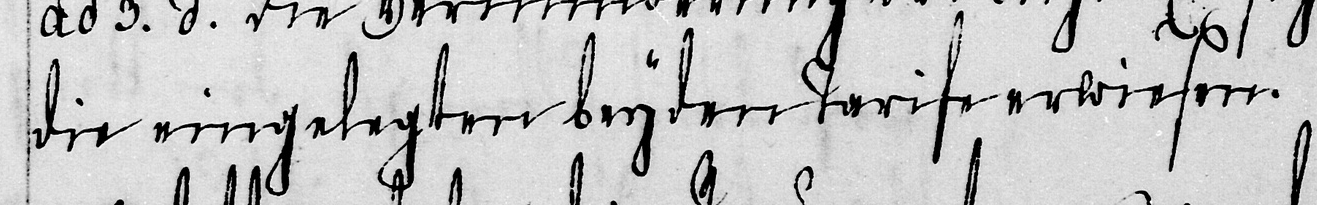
die eingelegten beyden Tarife erwiesen.
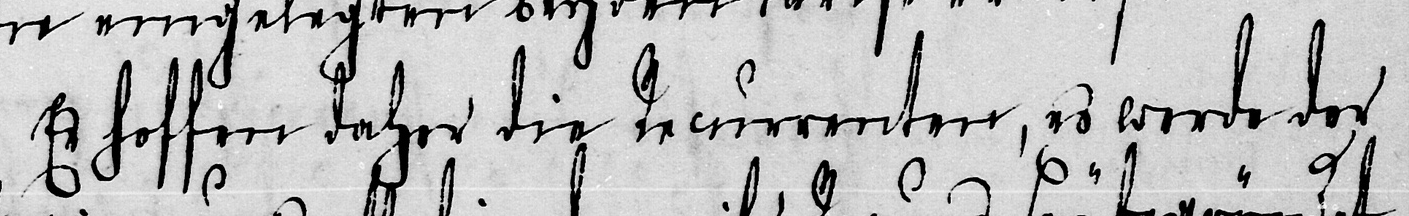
Es hoffen daher die Recurrenten, es werde der
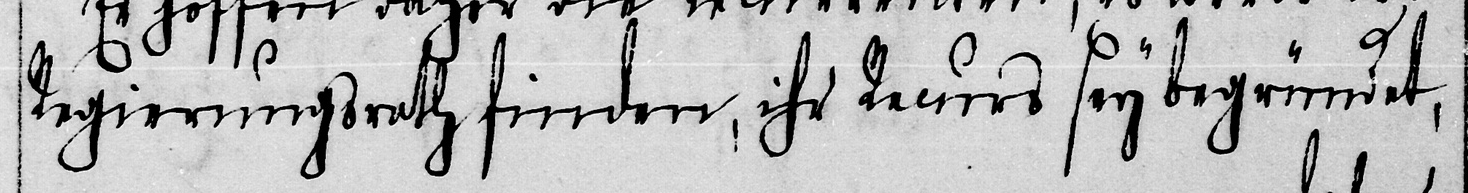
Regierungsrath finden, ihr Recurs sey begründet,
